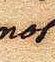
nos
